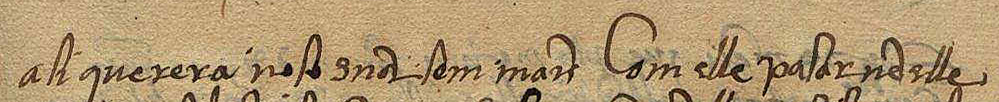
asi querera noso snōr sem maīs Com elle pasar nē elle
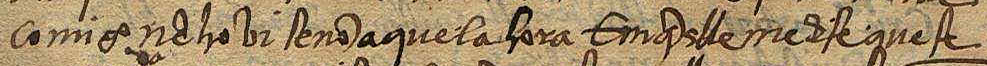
comigo nē ho vise nō aquela hora Em q̄ elle me dise que se
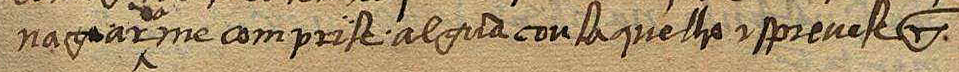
na g_arda me comprise alguā cousa que lho espreuese c̄ꝭ
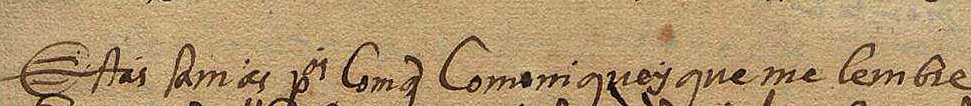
Estas sam as pas Com q̄ Comoniquey que me lembre
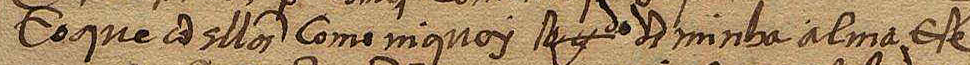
E o que cō Ellās comoniquey segdo ds̄ minha alma E se
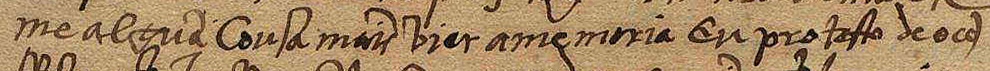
me alguā cousa maīs vier a memoria Eu protesto de o cō
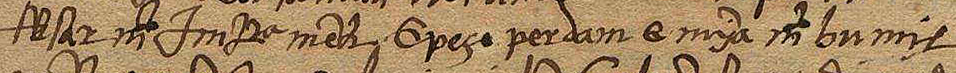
ffesar mto Jmtramēte E peço perdam e mȳa mto humil
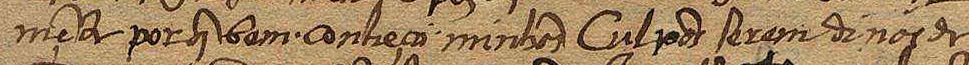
mēte porq̄ bem conheço minhas Culpas serem dinas de
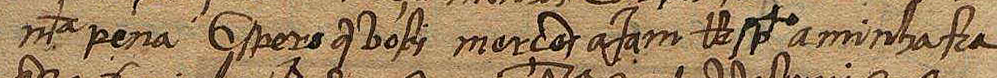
mta pena Espero q̄ vosas mercēs aJam Respto a minha fra
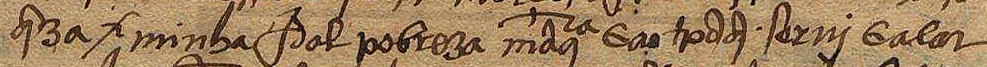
q̄za e minha Jdal pobreza māqra E ao tpō q̄ seruj E a lar
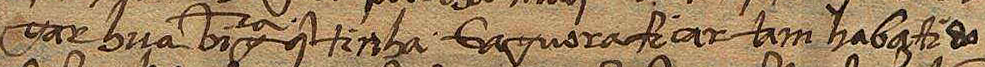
gar huā vigra q̄ tinha E aguora ficar tam habatido
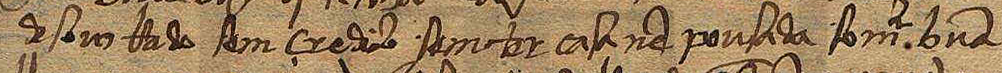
desomRado sem credito sem ter casa nē pousada somte hūa
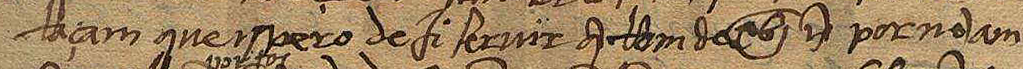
Raçam que espero de Jr seruir q̄ Remde xbj̄ r̄s por nō am
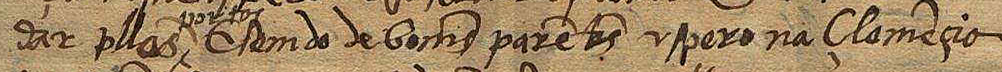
dar pllas̄ portas E semdo de boms parētes espero na Clemēcia
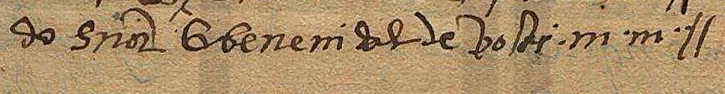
do snōr E benenidal de vosas m. m. //
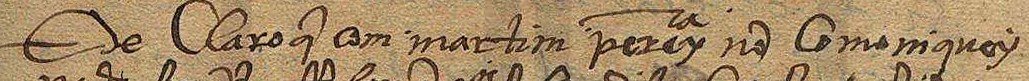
E deClaro q̄ com martim pereyra nō Comoniquey
